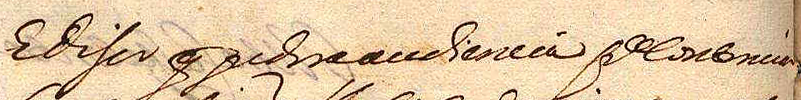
E diser q̄ pedira audiencia pa contenuar
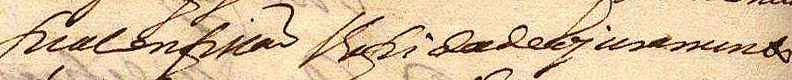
sua confissaõ lhe foi dado o juramento
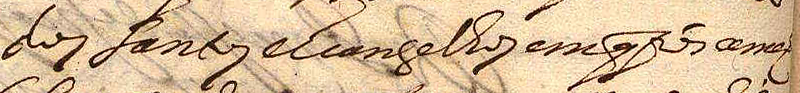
dos santos euangelhos em q̄ pós a maõ
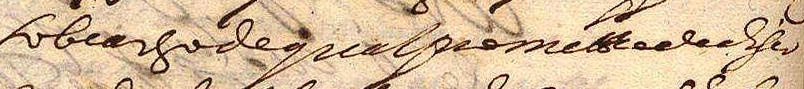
sob cargo do qual prometteo de diser
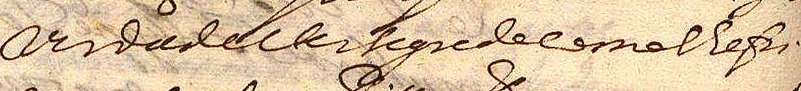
verdade e ter segredo como lhe foi
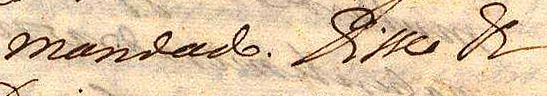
mandado. Disse &
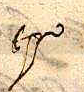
tpo
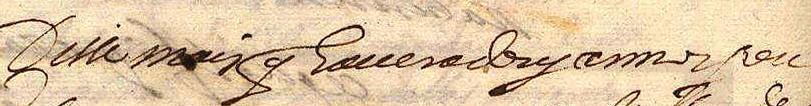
Disse mais q̄ hauera dous annos pou
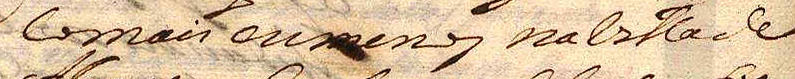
co mais ou menos na Villa de
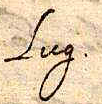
Lug.
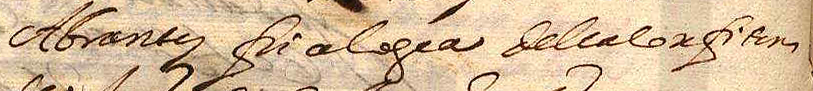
Abrantes foi a logea della confiten
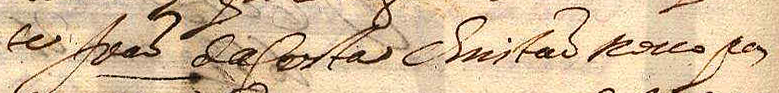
te Joaõ da Costa christaõ nouo pa
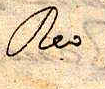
Reo
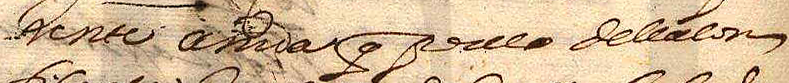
rente ainda q̄ pouco della con
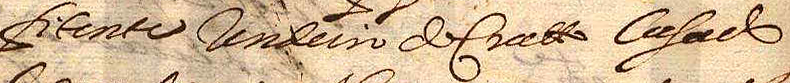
fitente Rendeiro do Cratto casado
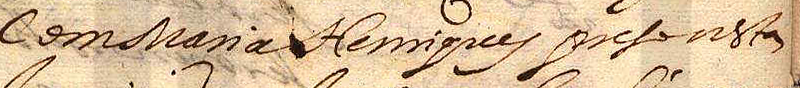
com Maria Henriques preso nesta
